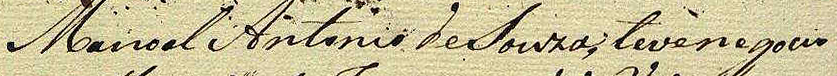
Manoel Antonio de Souza, teve negocio
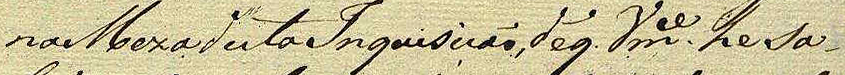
na Meza desta Inquisiçaõ, de q̄ Vm.ce he sa
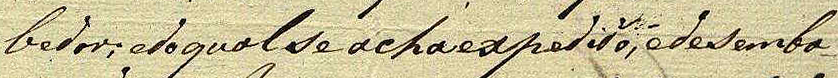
bedor; e do qual se acha expedido, e desemba
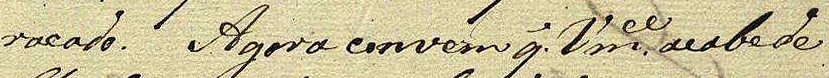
raçado. Agora convem q̄ Vm.ce acabe de
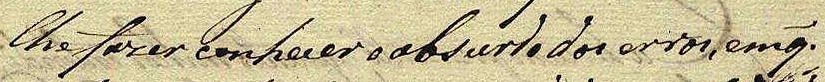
lhe fazer conhecer o absurdo dos erros, em q̄
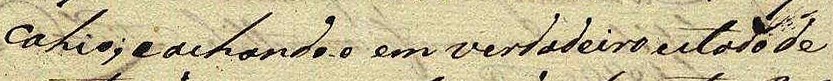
cahio; e achando-o em verdadeiro estado de
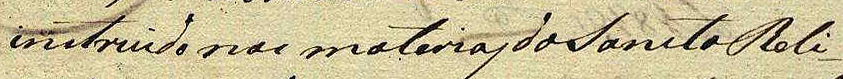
instruido nas materias da Santa Reli
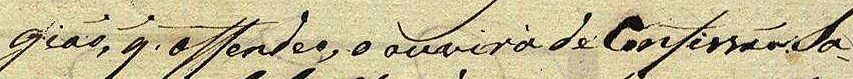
giaõ, q̄ offendeo, o ouvirá de Confissaõ Sa
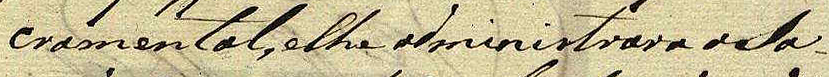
cramental, e lhe administrara a Sa
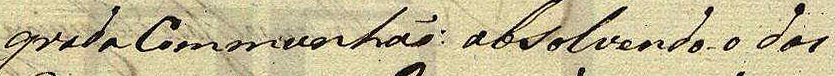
grada Communhaõ: absolvendo-o das
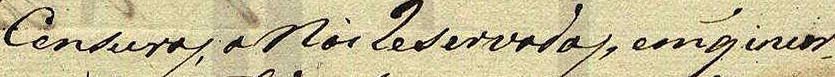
Censuras, a nós Reservadas, em q̄ incor
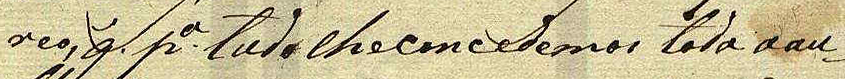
reo, q̄ p.a tudo lhe concedemos toda a au
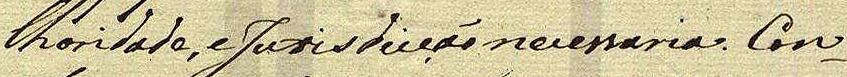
thoridade, e Jurisdiçaõ necessaria. Con
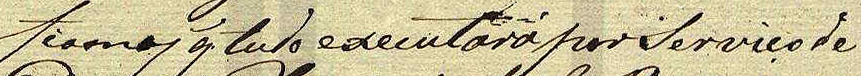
fiamos q̄ tudo executará por Serviço de
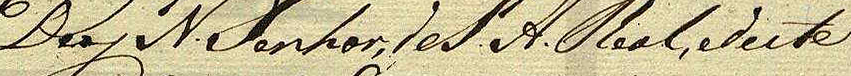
Deos N. Senhor, de S. A. Real, e deste
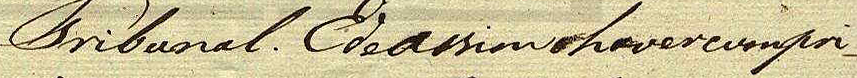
Tribunal. E de assim haver cumpri
